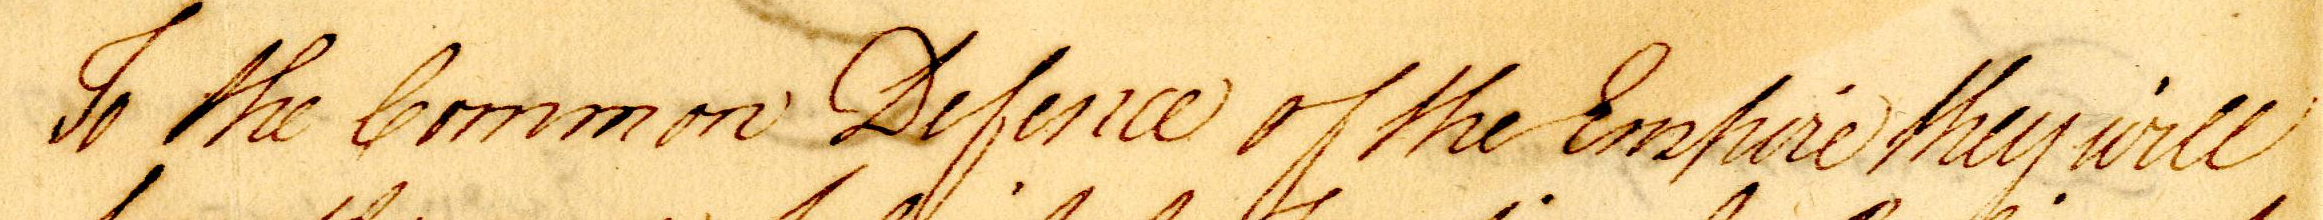To the Common Defence of the Empire they will
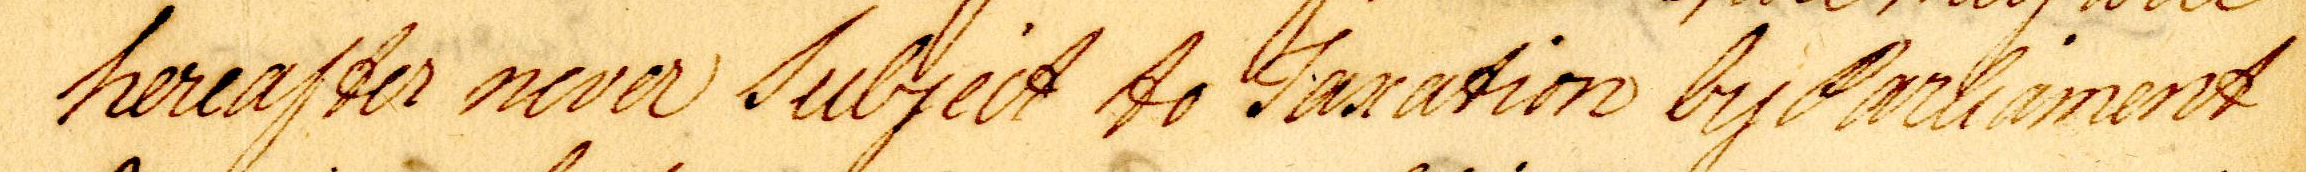hereafter never subject to Taxation by Parliament
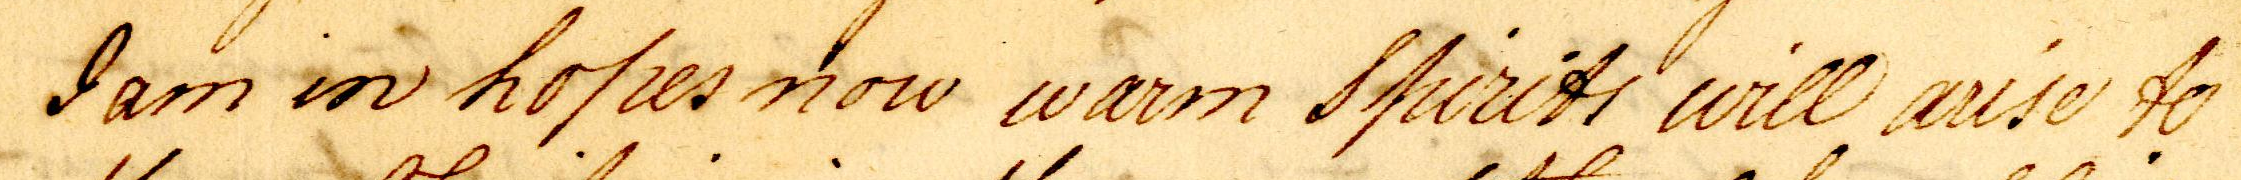I am in hopes now warm spirits will arise to
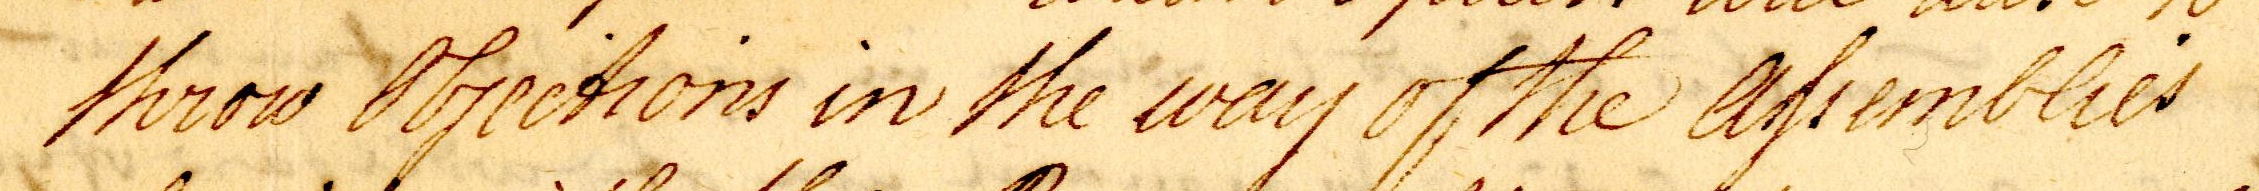throw Objections in the way of the assemblies
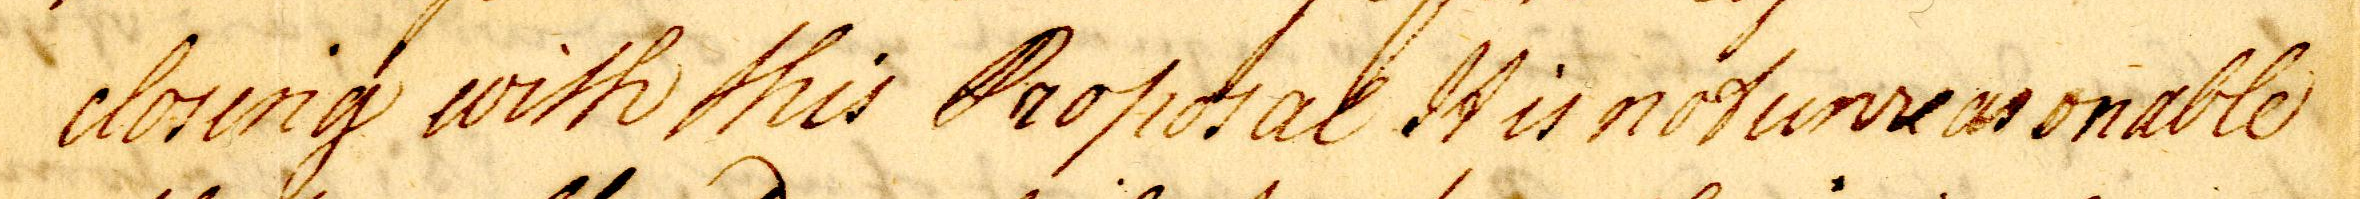closing with this Proposal It is not unreasonable
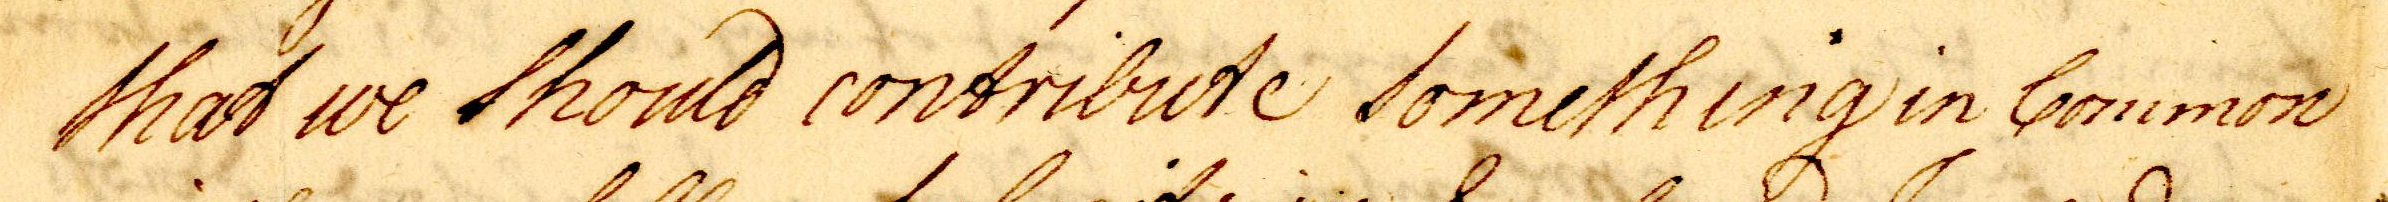that we should contribute something in Common
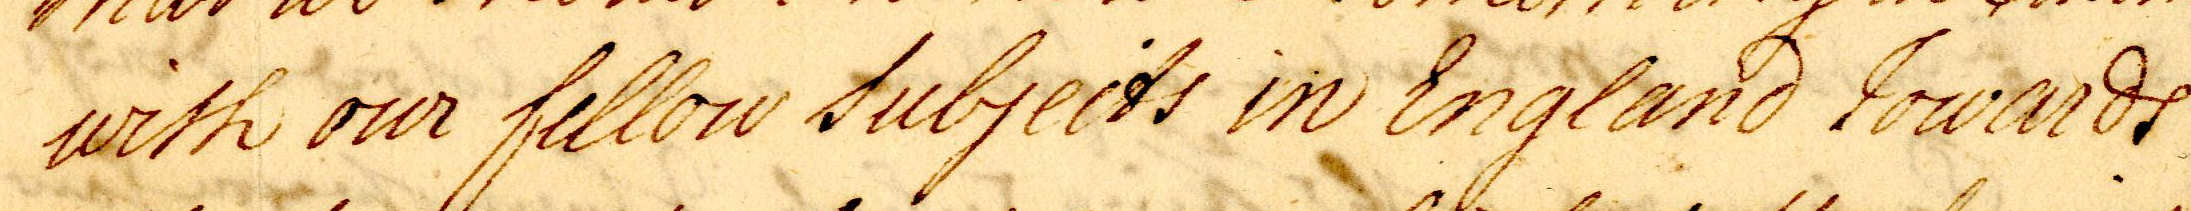with our fellow subjects in England towards
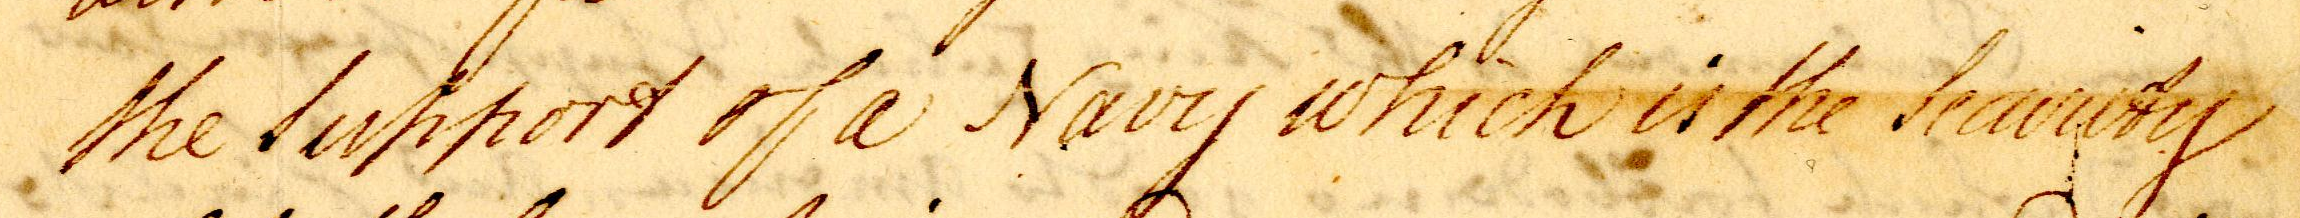the support of a Navy which is the beauty
